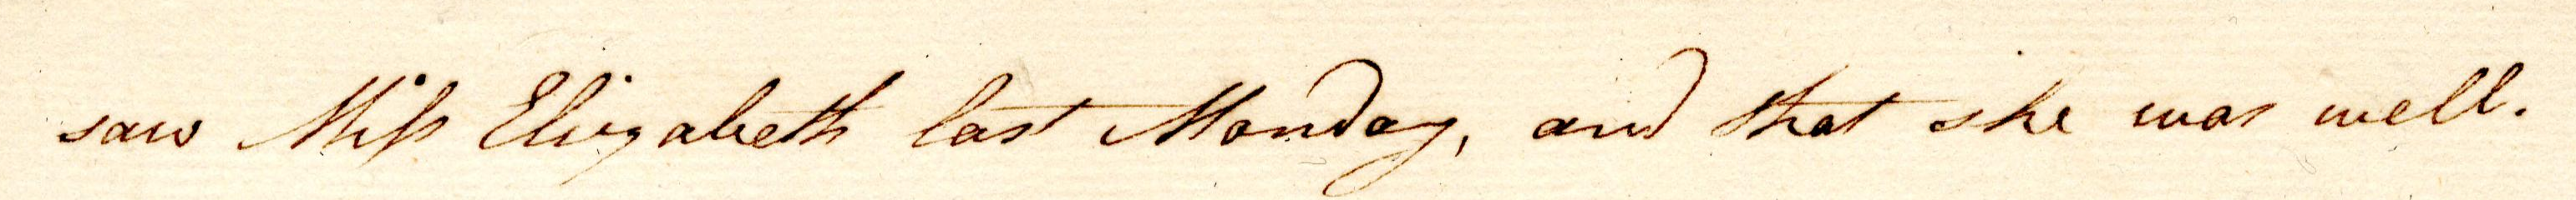saw Miss Elizabeth last Monday, and that she was well.
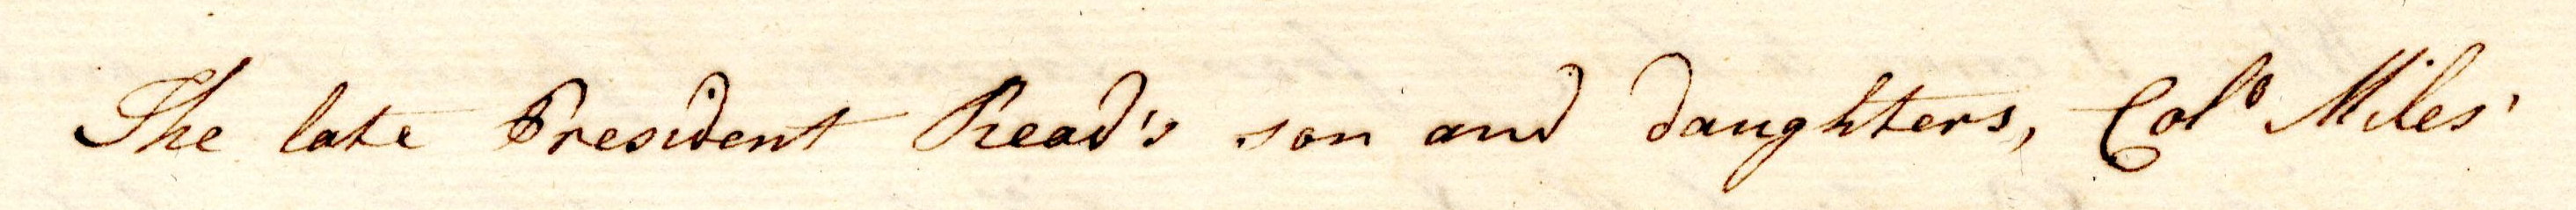The late President Read's son and daughters, Col^o. Miles'
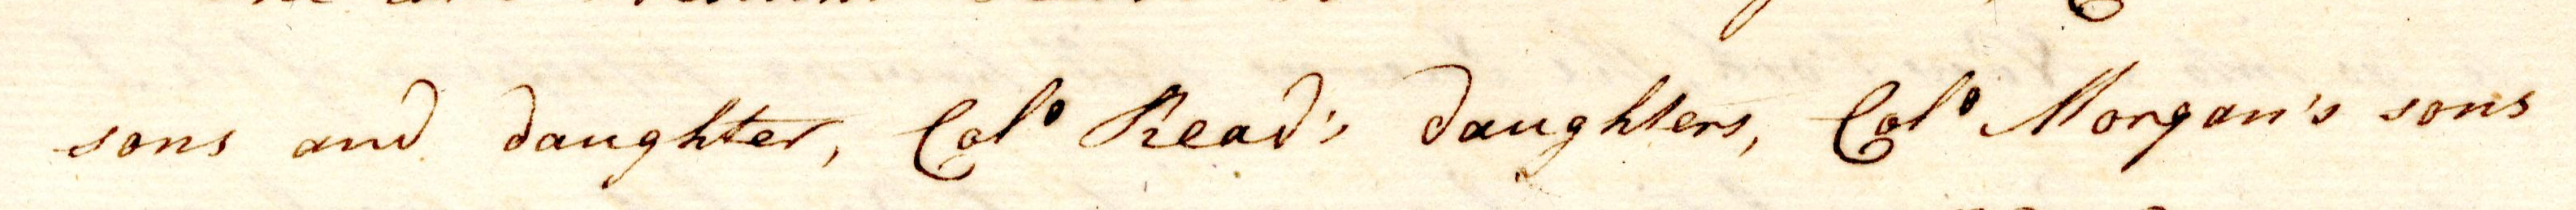sons and daughter, Col^o Read's daughters, Col^o. Morgan's sons
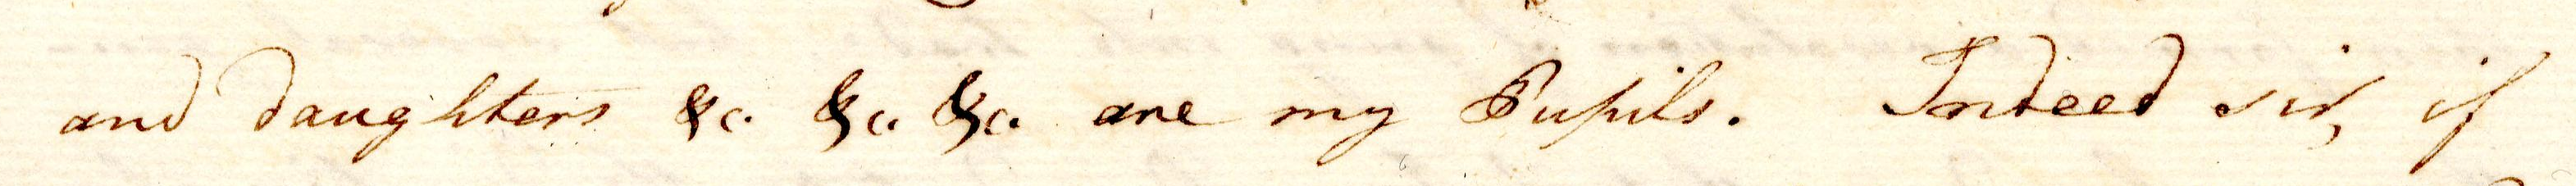and daughters &c. &. &c. are my Pupils. Indeed sir if
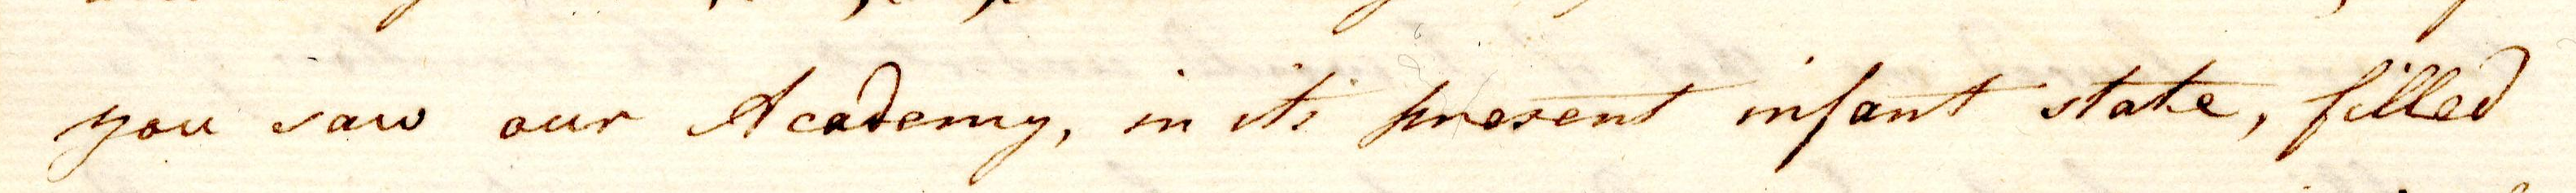you saw our Academy, in its present infant state, filled
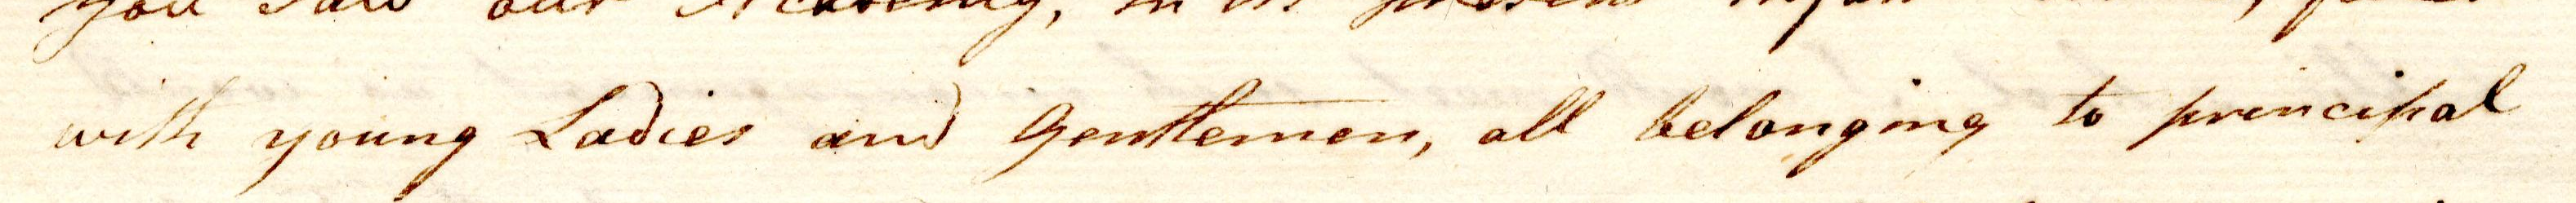with young Ladies and Gentlemen, all belonging to principal
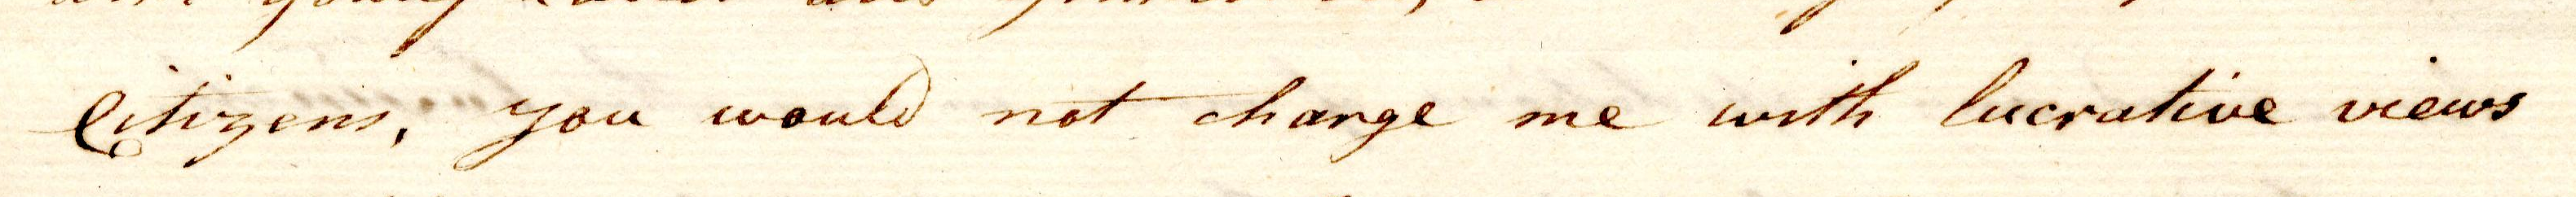Citizens, you would not charge me with lucrative views
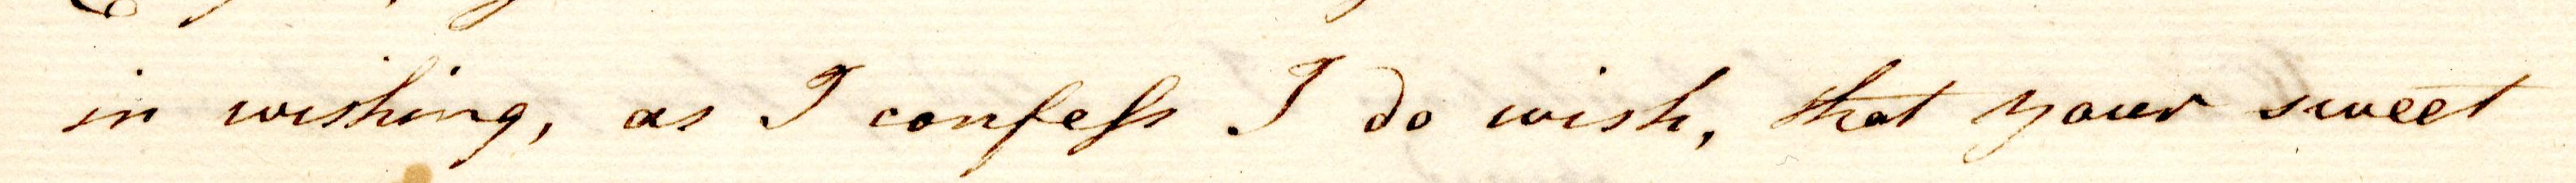in wishing, as I confess I do wish, that your sweet
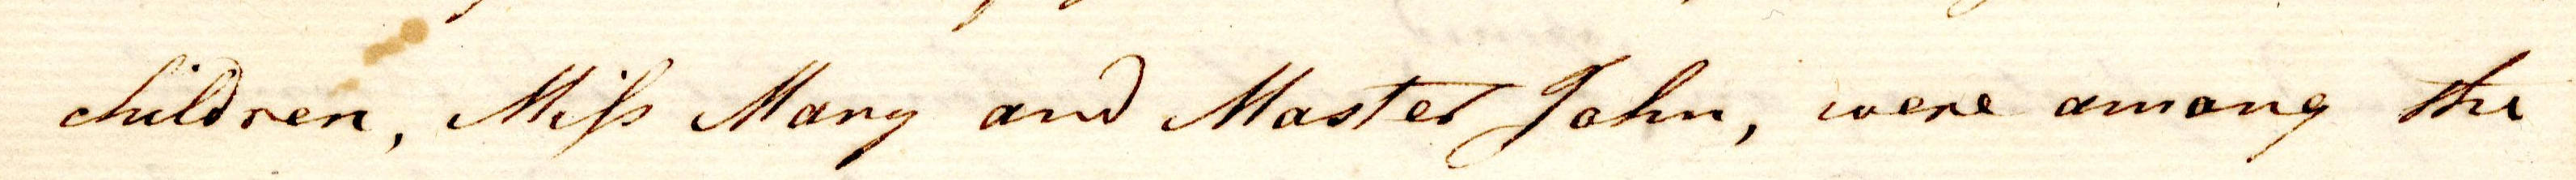children, Miss Mary and Master John, were among the
